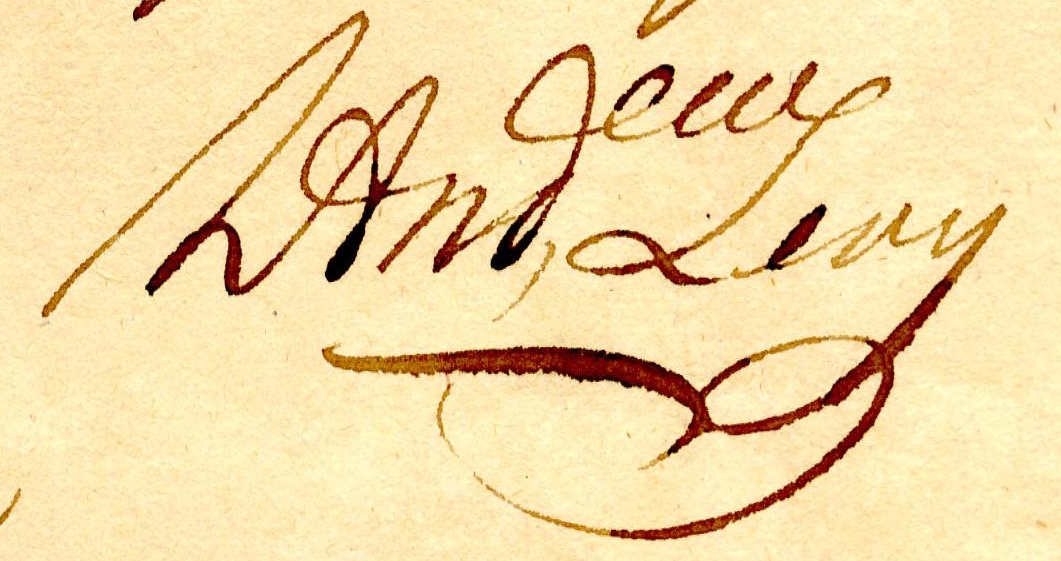And^rew Levy
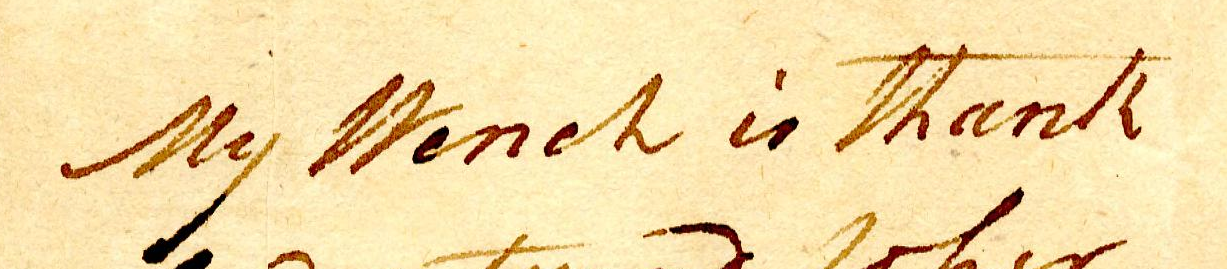My Wench is thank
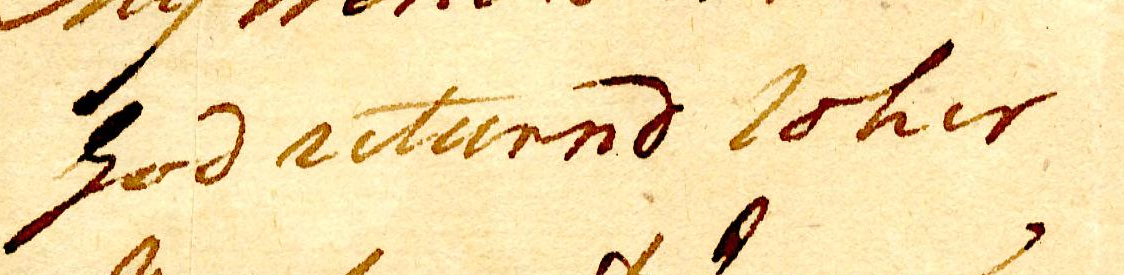God returnd to her
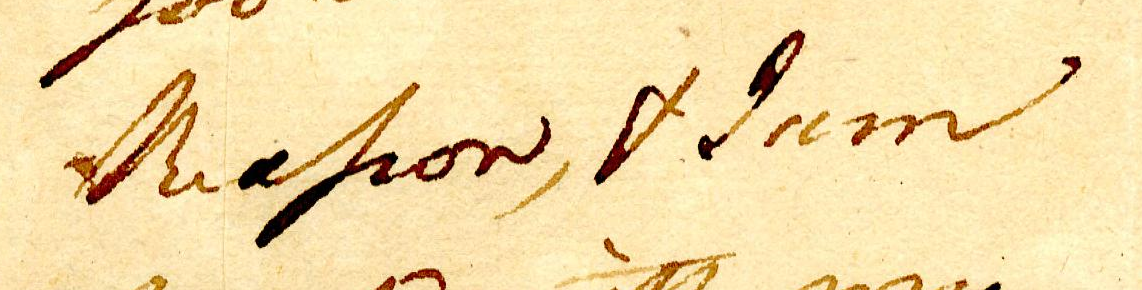Reason, & I am
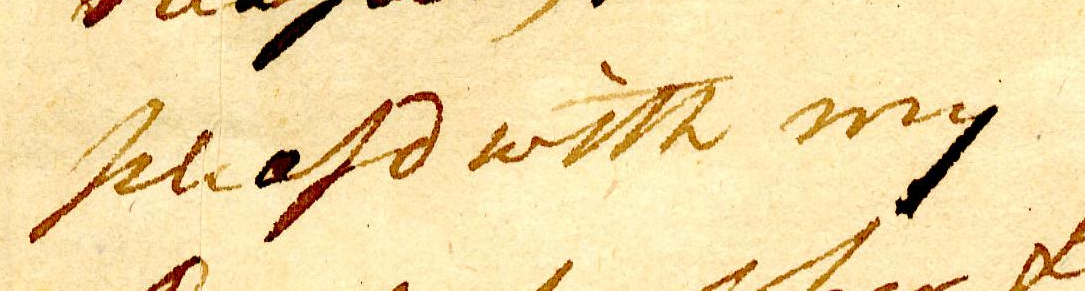pleasd with my
